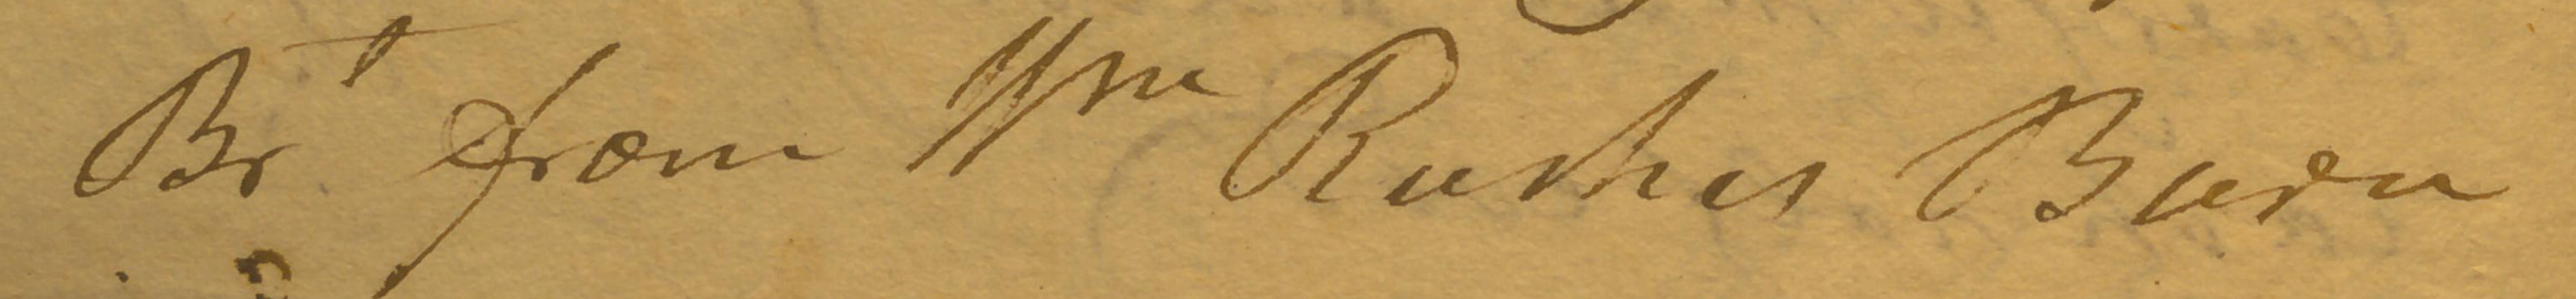Br^t from W^m. Rushes Barn
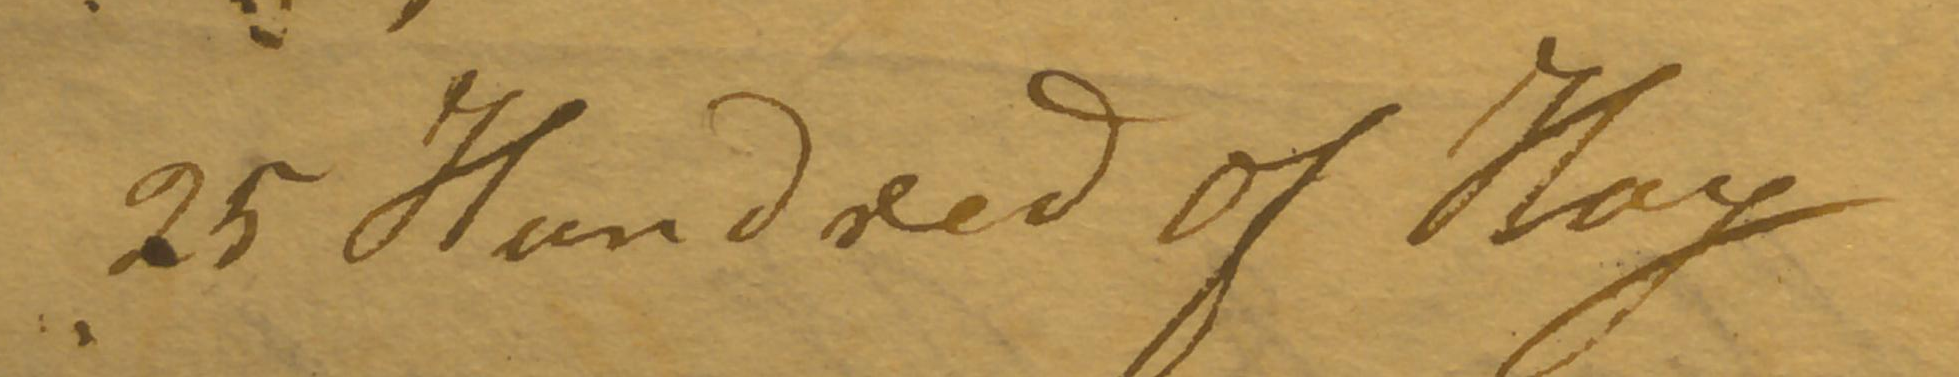25 Hundred of Hay
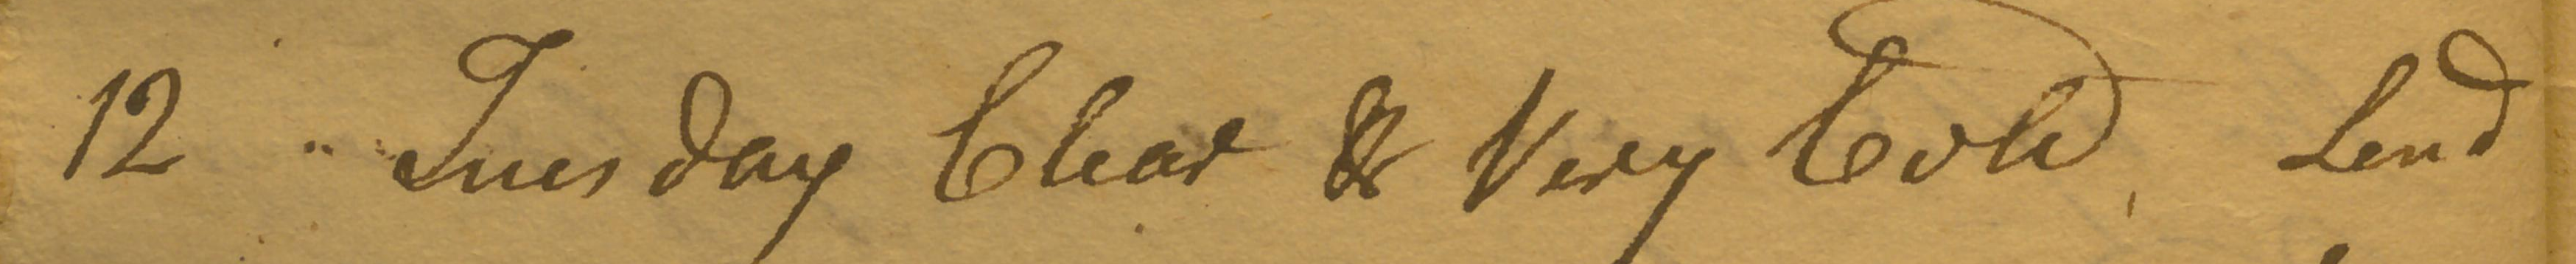12. Tuesday Clear & Very Cold Lend
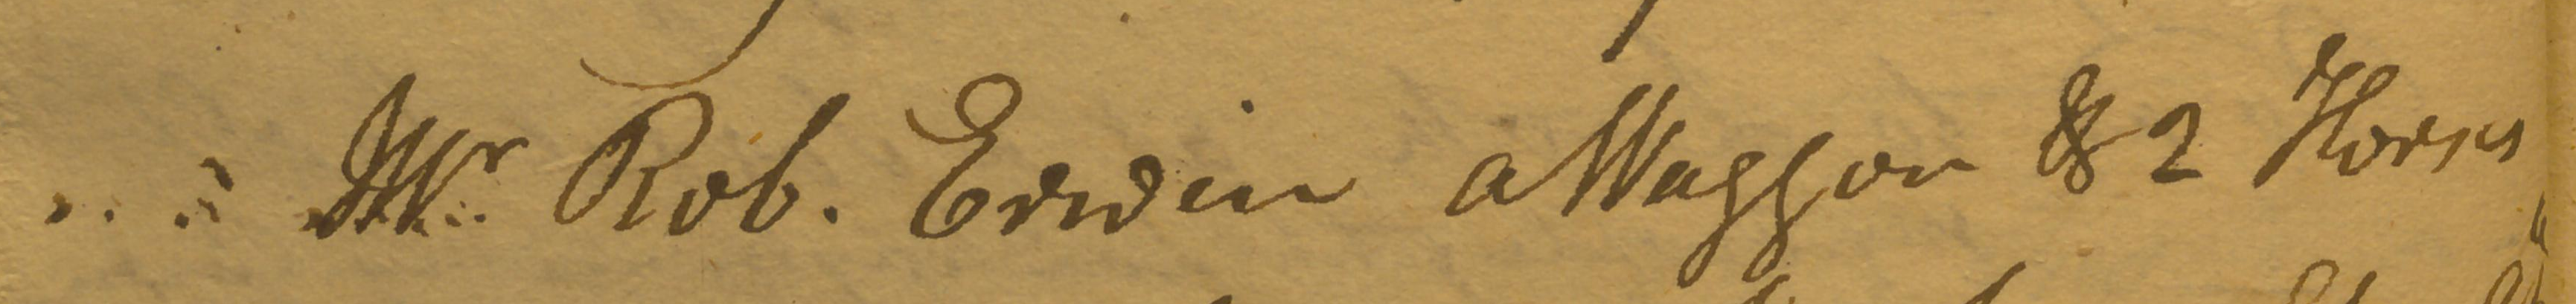M^r. Robt. Erwin a Waggon & 2 Horses
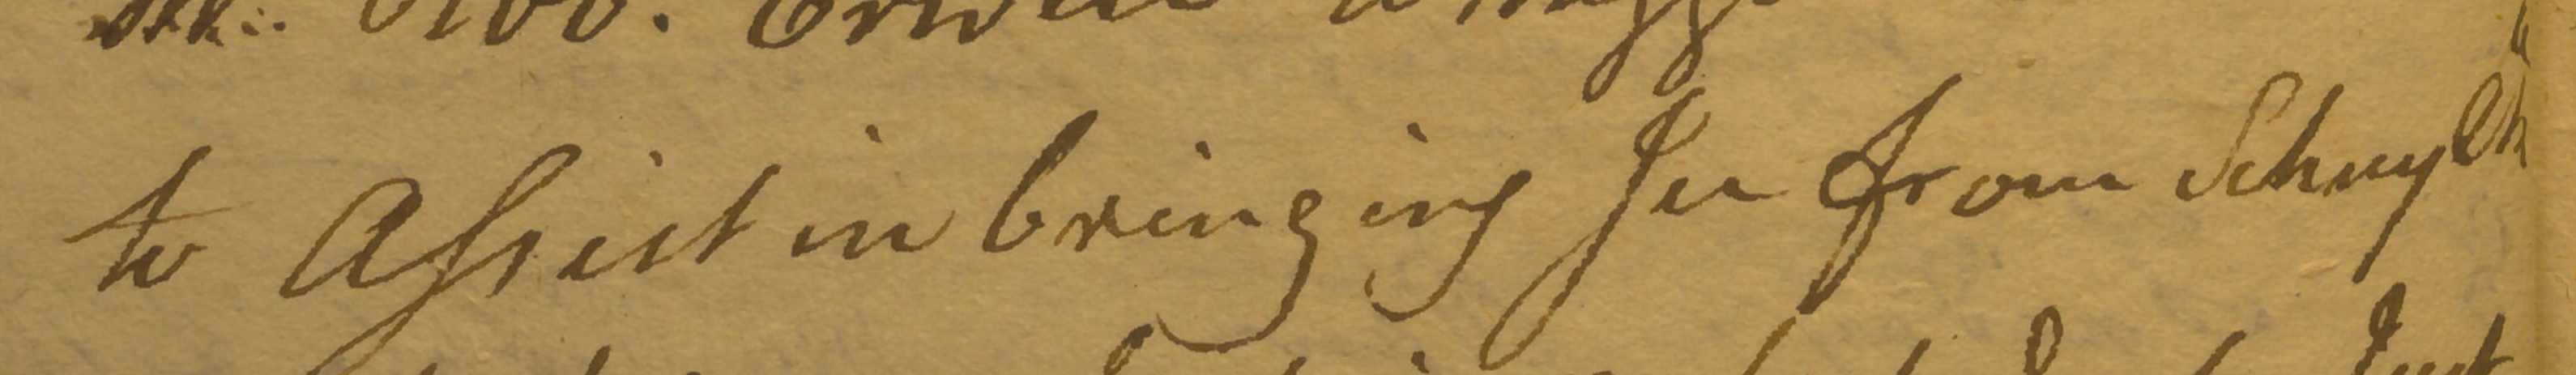to Assist in bringing Ice from Schuylk
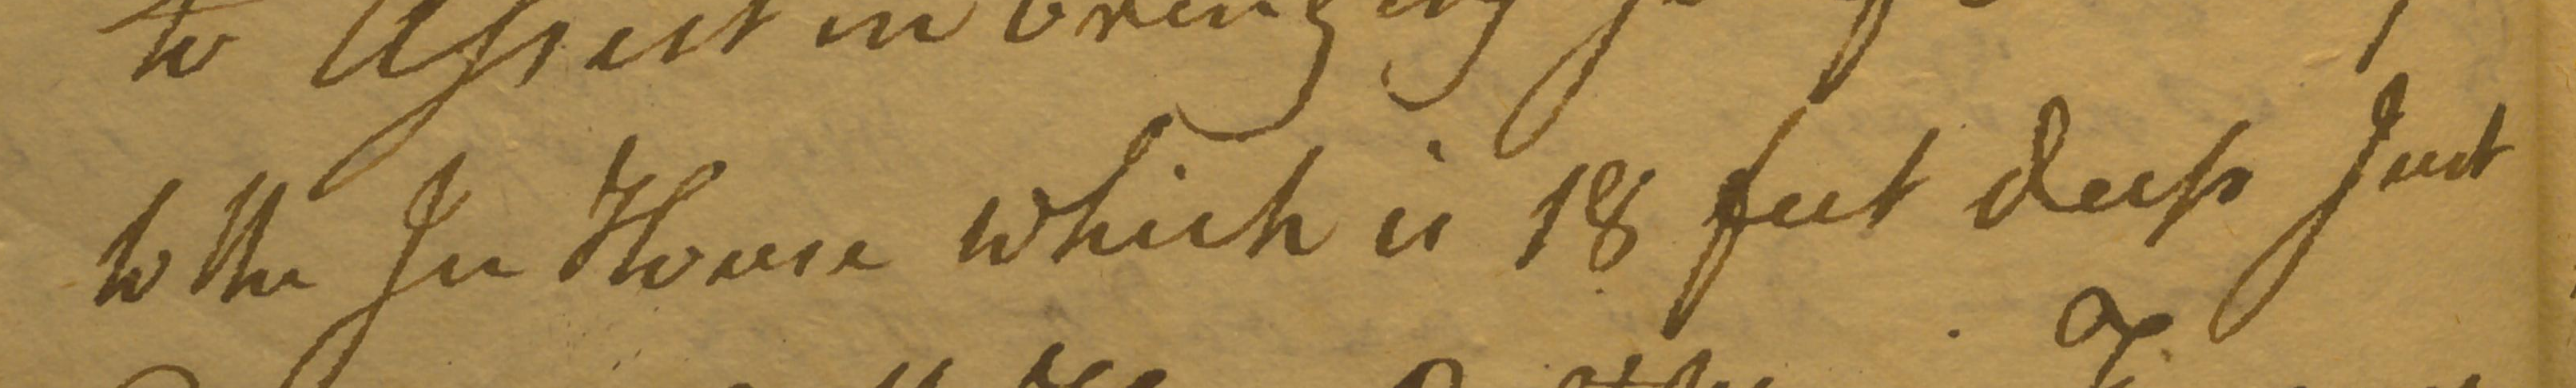to the Ice House which is 18 feet deep Just
